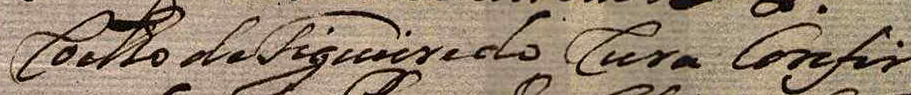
Coelho de Figueiredo Cura Confir
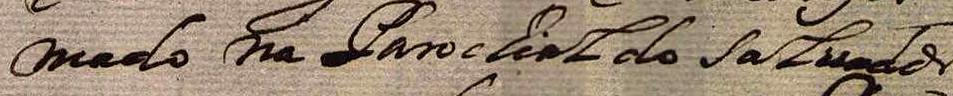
mado na Parochial do Saluador
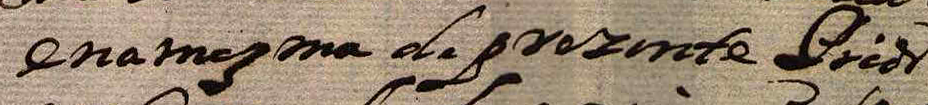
e na mezma de prezente Prior
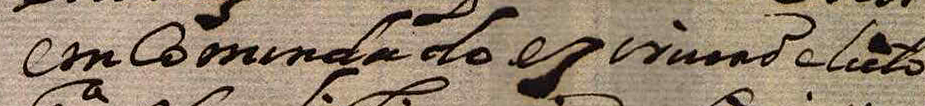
emcomendado ezcriuaaõ electo
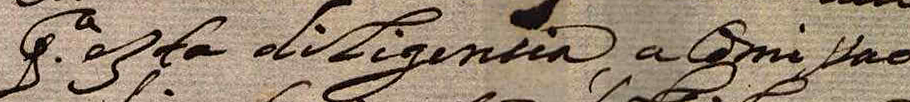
p.a ezta diligencia a Comissaõ
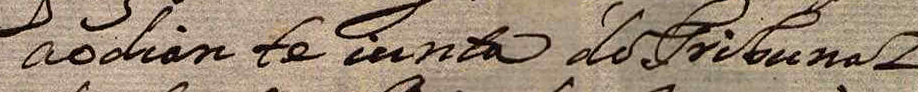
ao diante iunta do TribunaL
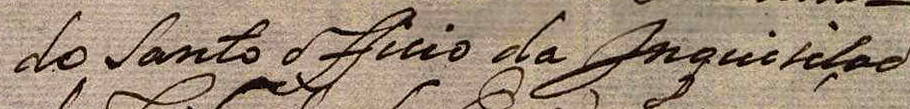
do Santo officio da Jnquisiçaõ
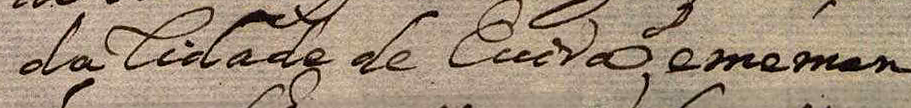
da Cidade de Euora, e me man
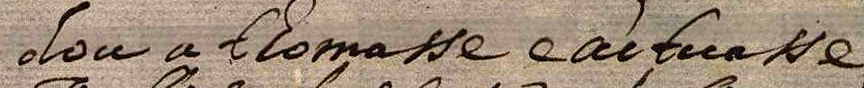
dou a thomasse e actuasse
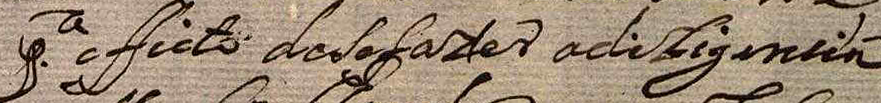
p.a effeito de se fazer a diligencia
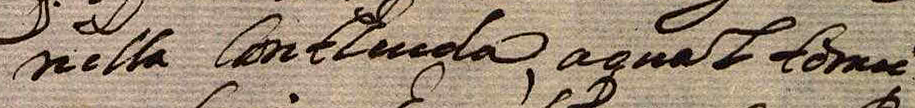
nella contheuda, a qual tomei
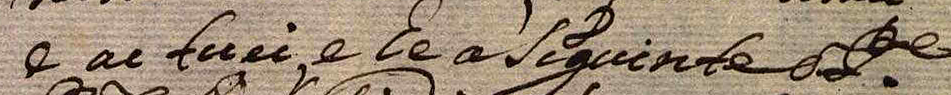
e actuei, e he a seguinte o P.e
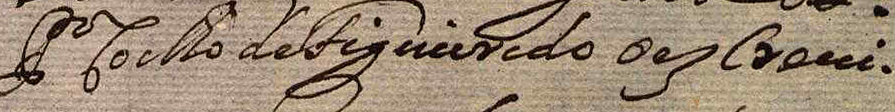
Po Coelho de Figueiredo o ezCreui.
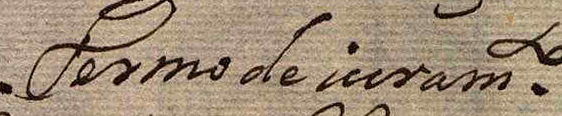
Termo de iuram.to
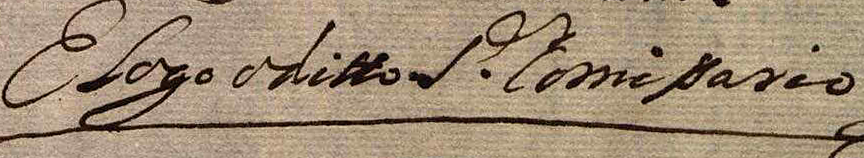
E logo o ditto S.or comissario
